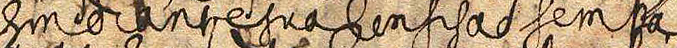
Em diante sua Confisaõ sem va
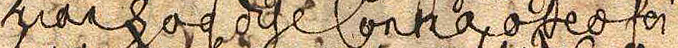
riar ho q̄ dise Contra o Reo foi
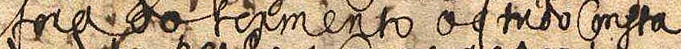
fora do tormento o q̄ tudo Consta
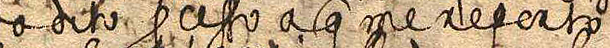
do dito ꝓçesso a q̄ me reporto
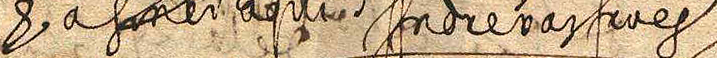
E asinei aqui André vaz froes
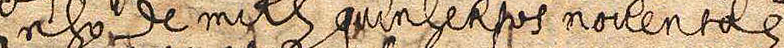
nho de mil E quinhentos nouenta E
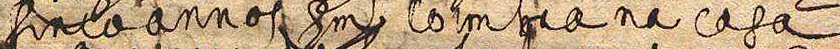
ssinco annos Em Coimbra na casa
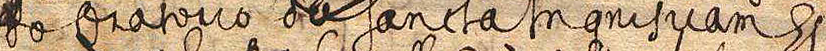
do Oratorio da sancta Inquisiçam Es
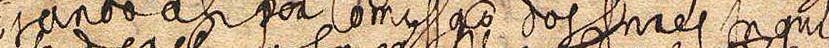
tando ahi por Comissaõ dos snres Jnqui
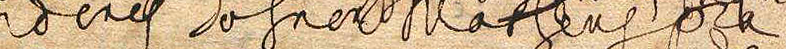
sidores do snor Matheus pra
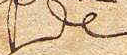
de
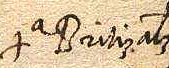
ta Britiz al̄z
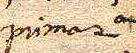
prima 2a.
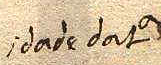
idade da ta
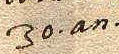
30. an.
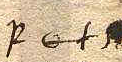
Ro? t _
